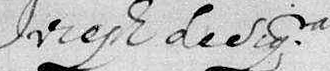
Iozeph de siq.ra
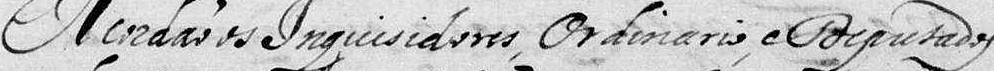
Acordaõ os Inquisidores, Ordinario, e Deputados
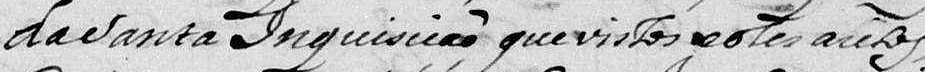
da Santa Inquisiçaõ, que vistos estes autos,
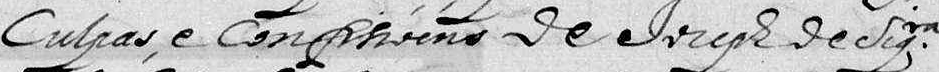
Culpas, e Confissoens de Iozeph de Siq.ra
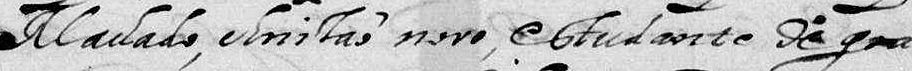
Machado, christaõ novo, estudante de gra
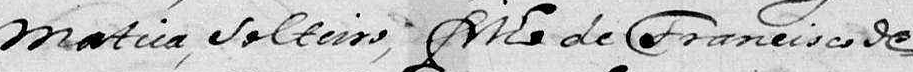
matica, solteiro, filho de Francisco de
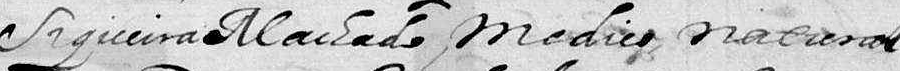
Siqueira Machado medico natural
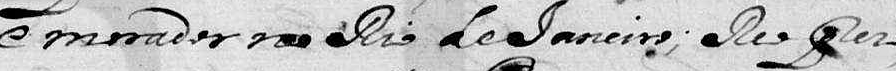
e morador no Rio de Ianeiro, Reo prezo,
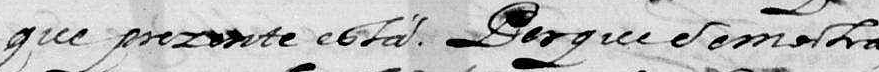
que prezente está. Porque se mostra
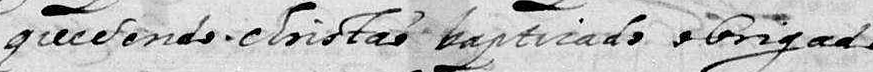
que sendo cristaõ baptizado obrigado
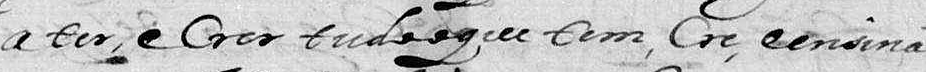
a ter, e crer tudo o que tem, Cre, e ensina
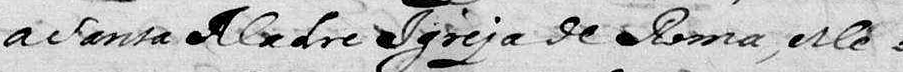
a santa Madre Igreja de Roma, elle o
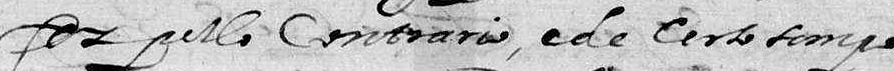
fez pello contrario, e de certo tempo
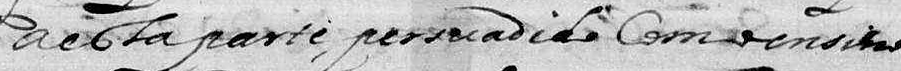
a esta parte, persuadido com o ensino
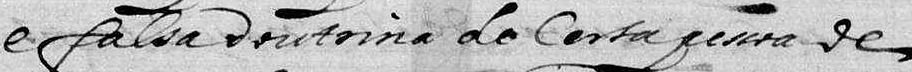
e falsa doutrina de certa pessoa de
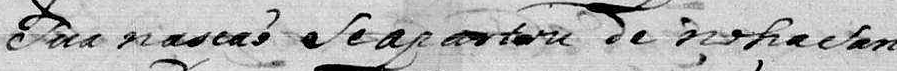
sua nasçaõ se apartou de nossa san
